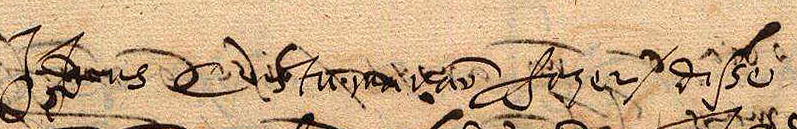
JeJuus Custumauão fazer / disse
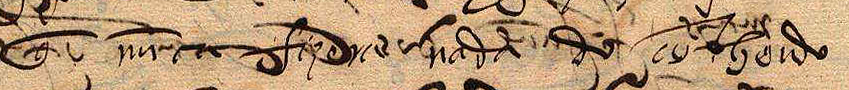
q̄ nūca fizera nada do c̄otheudo
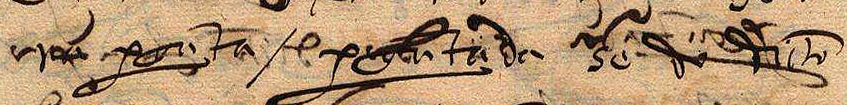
na ꝑgūta /e ꝑgūtada se do dicto
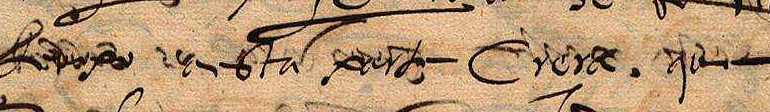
tempo a esta parte Crera. que
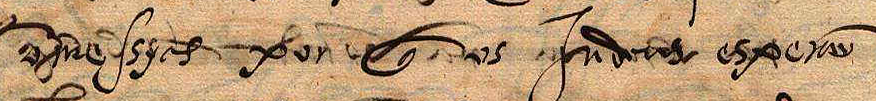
o messyas por q̄ os Judeus esperão
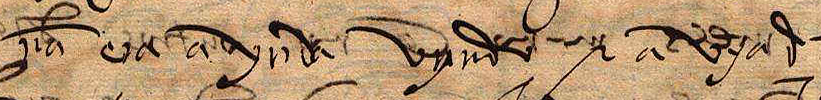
nā era aynda vyndo e avya de
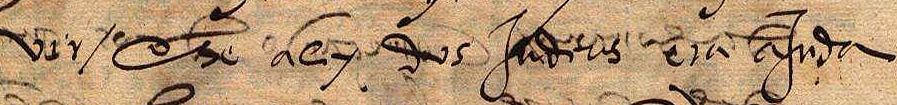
vir / e se a ley dos Judeus era aJuda
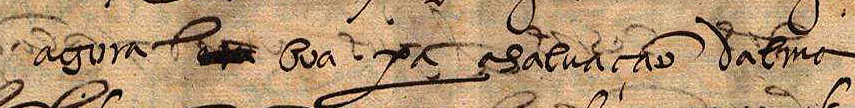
agora era boa ꝑa a saluação dalma
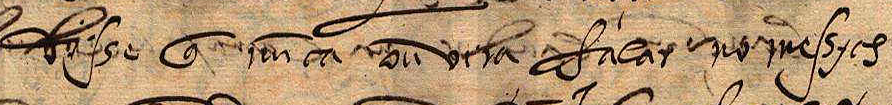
disse q̄ nūca ouvira falar no messyas
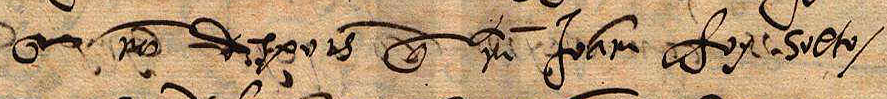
se n̄o despois q̄ mte Joam foy solto /
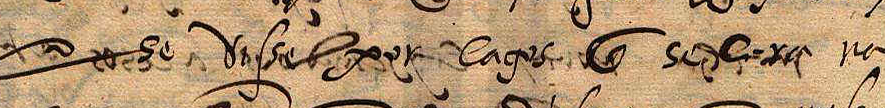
e se disse por lagos q̄ se lera na
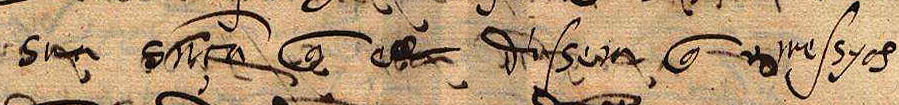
sua sn̄ça q̅ ele dissera q̅ o messyas
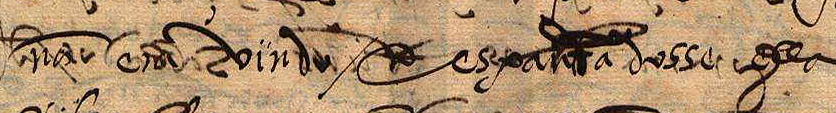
não era vindo / e espantadosse ella
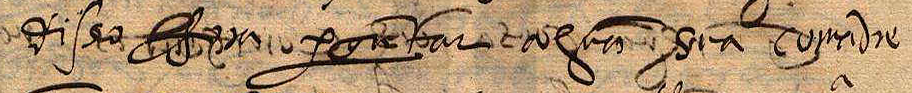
disso fora ꝑgu̅tar a hu̅a sua comadre
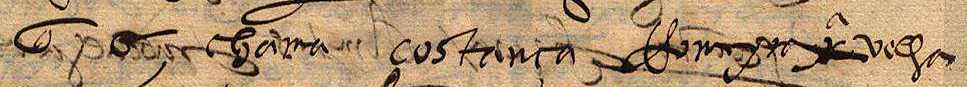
q̄ se chama costança Romeyra xa velha
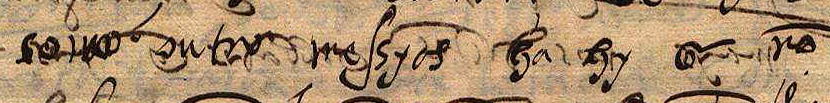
como outro messyas ha hy senā
